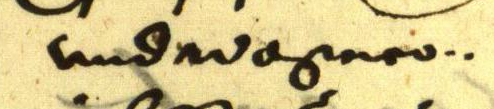vnd Wagner¬
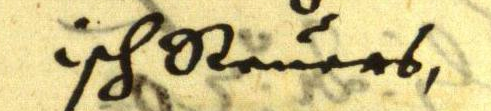isch Reūers,
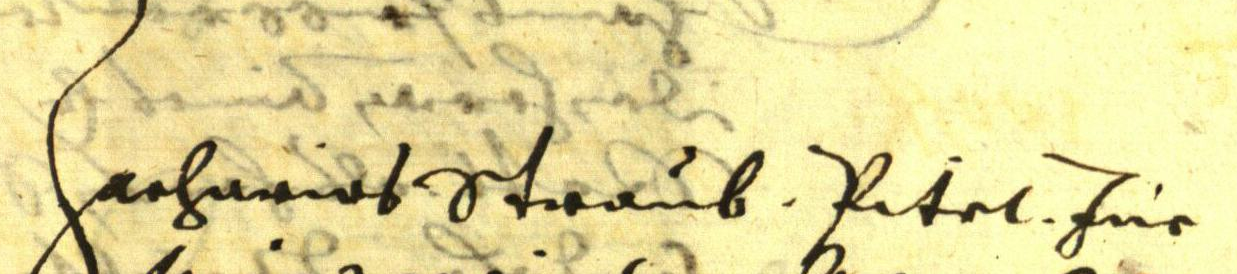Zacharias Straūb. Pitet. Ine
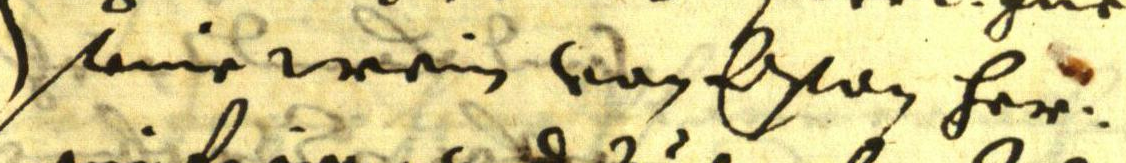seine Wein von Epan her¬
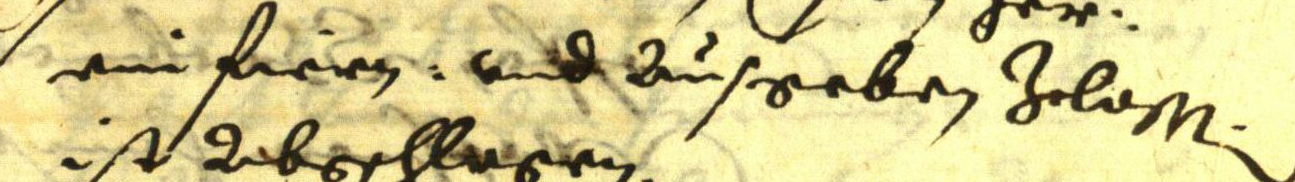ein fiern: vnd Aūsgeben Zelass.
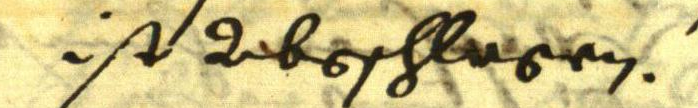ist Abgschlagen.
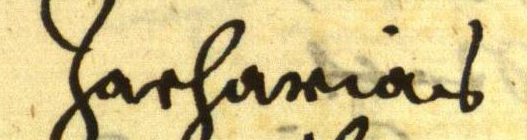Zacharias
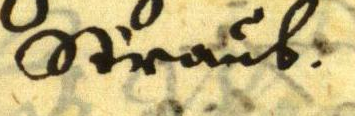Straūb.
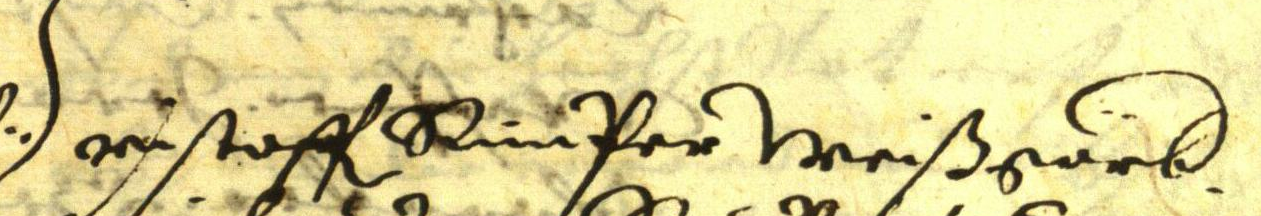Cristoff RimPer Weißgärb.
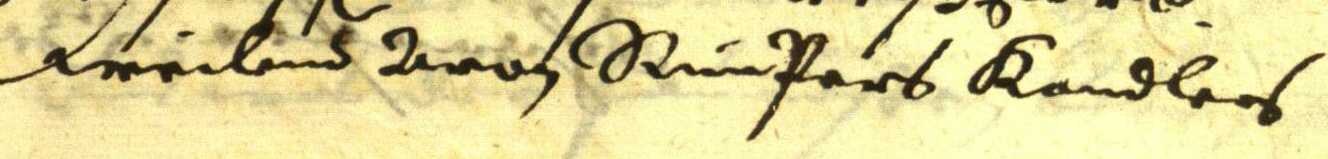weilend Aron RimPers Kandlers
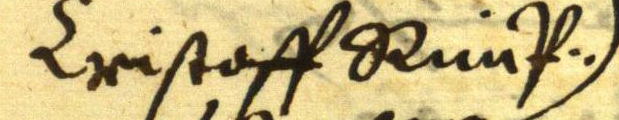Cristoff RimP¬
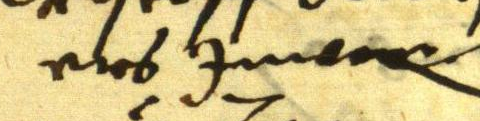ers Inwon¬
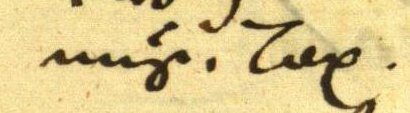ūng. Tax.
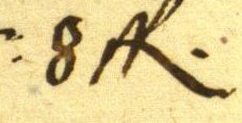—: 8 fl.
